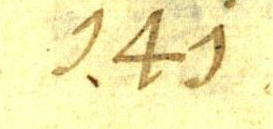241
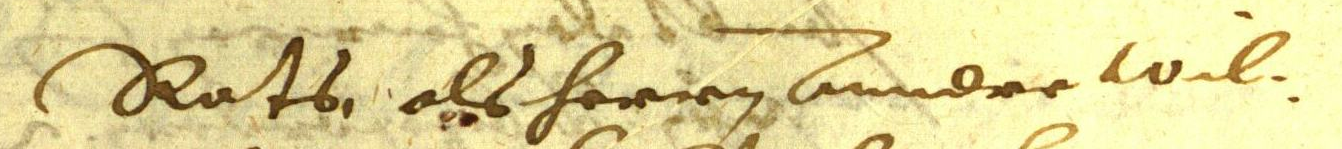Rats. als herrn Anndre Wil¬
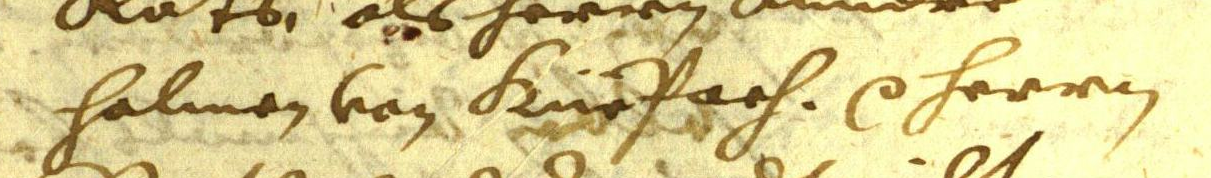halmen von KüePach. etc herrn
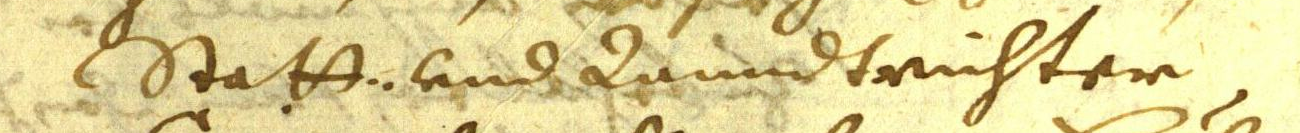Statt: vnd Lanndtrichter
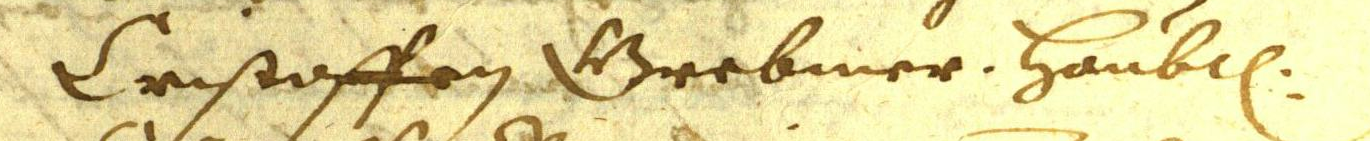Cristoffen Grebmer. Haūbt:
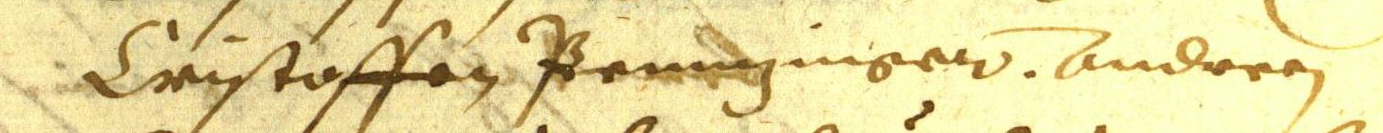Cristoffen Pennzinger. Andreen
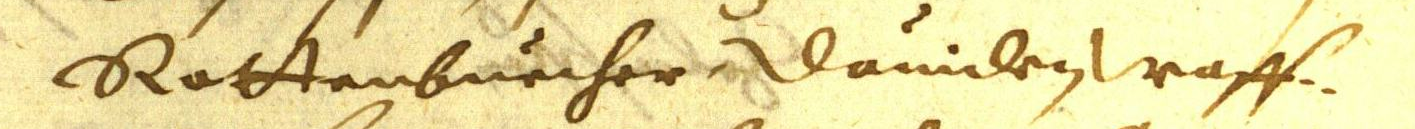Rottenbūecher. Daūiden Waff¬
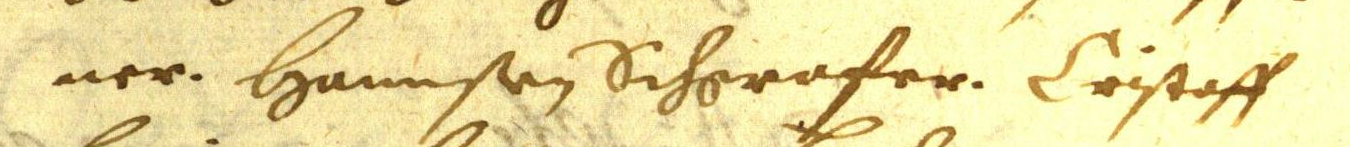ner. Hannsen Schgrafer. Cristoff
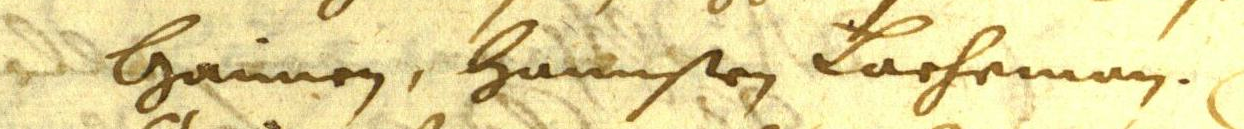Haimen, Hannsen Locheman.
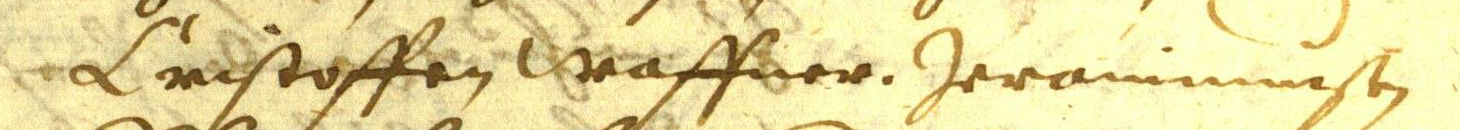Cristoffen Waffner. Jeronimūsen
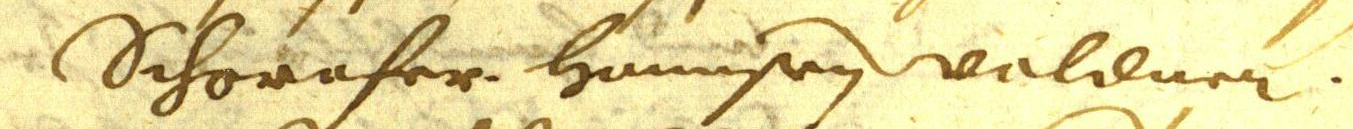Schgrafer. Hannsen Waldner.
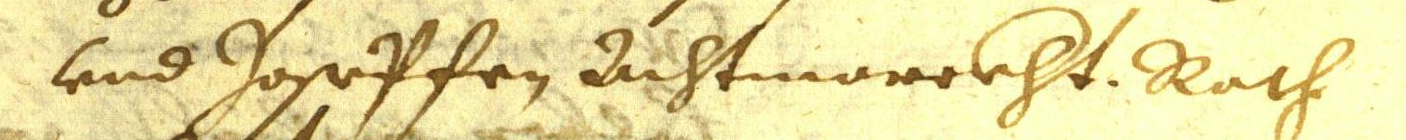vnd Joseffen Achtmarckht. Rath
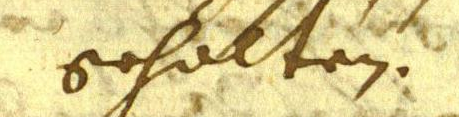gehalten.
